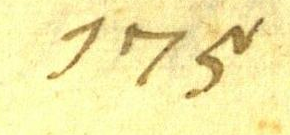175
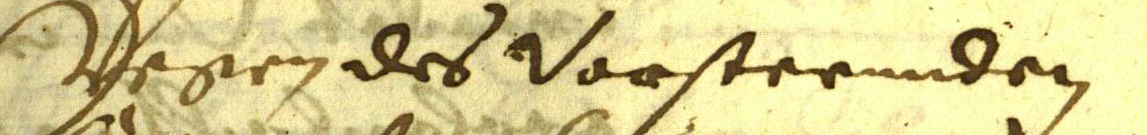Wegen des Vorsteenden
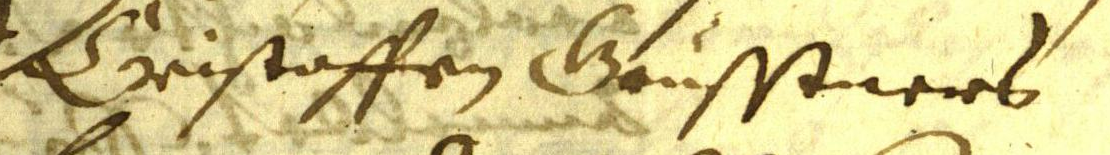Cristoffen Grūsstners
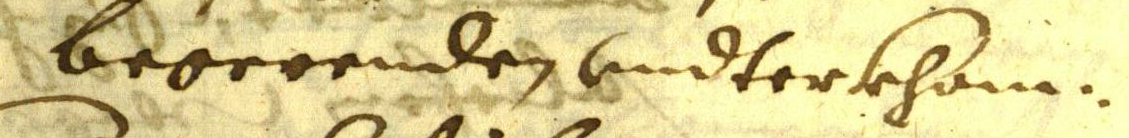begerenden vndterkhom¬
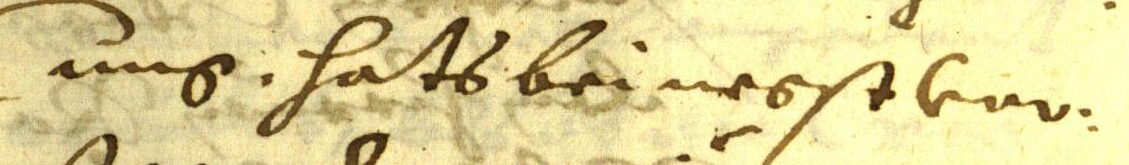ūng. Hats bei negst vor¬
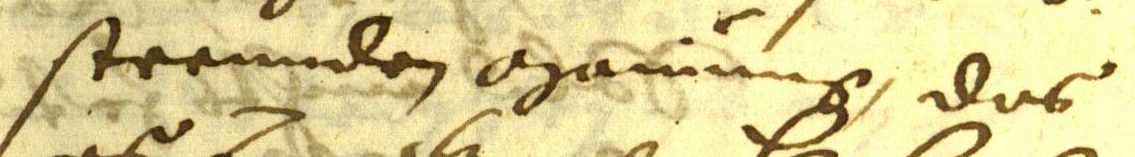steenden Mainūng, das
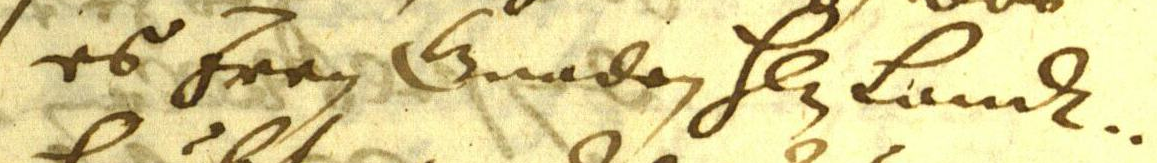es Iren Gnaden hln Landt¬
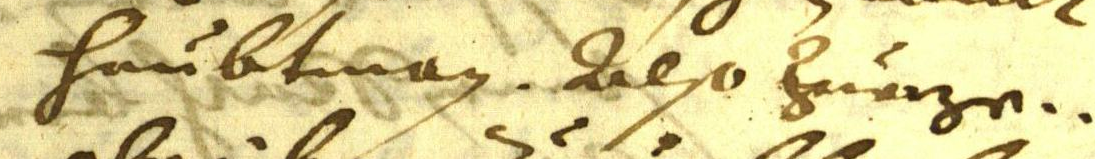haūbtman. Also Zūeze¬
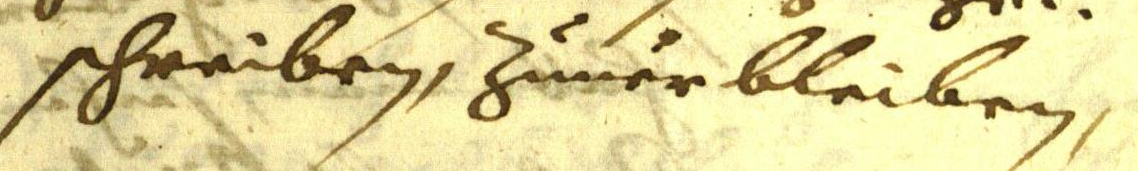schreiben, Zūūerbleiben,
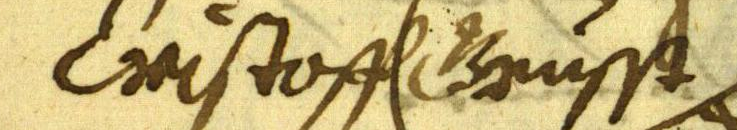Cristoff Grūsst¬
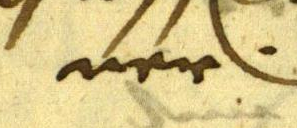ner.
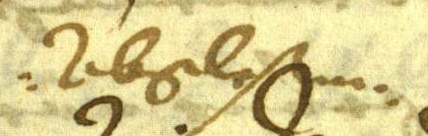:Abglesen:
